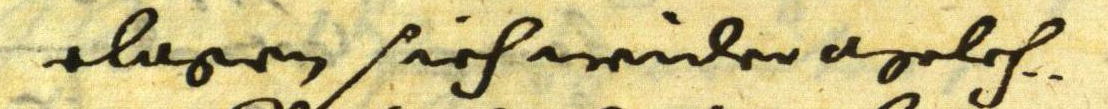clagen sich wider Melch¬
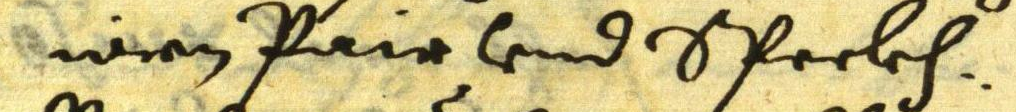iorn Pair vnd Speckh¬
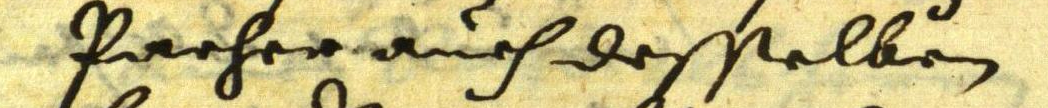Pacher aūch desselben
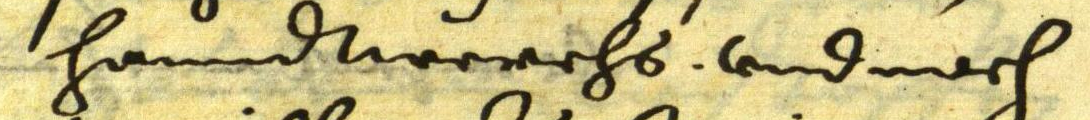Hanndtwerchs. vnd noch
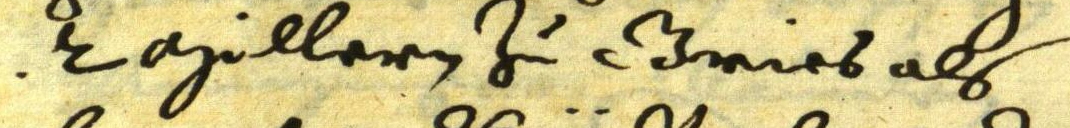.2 Millern Zū Gries als
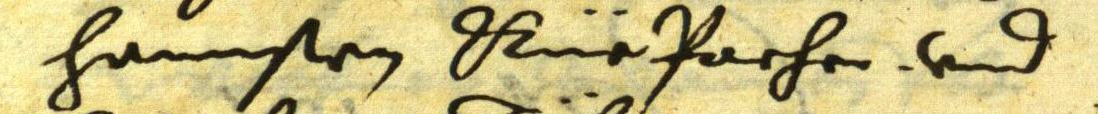hannsen KüePacher. vnd
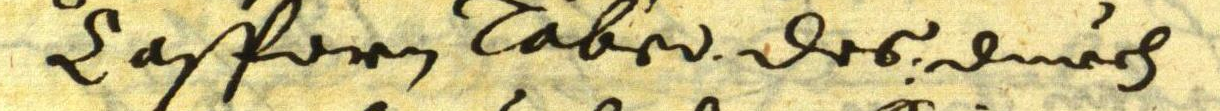Casparn Täber. des dūrch
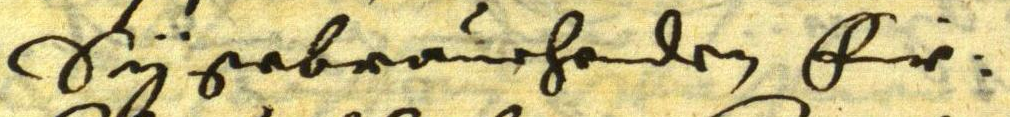Sÿ gebraūchenden Fir¬
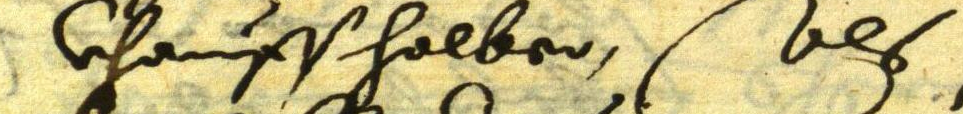khaūfs halber, Als
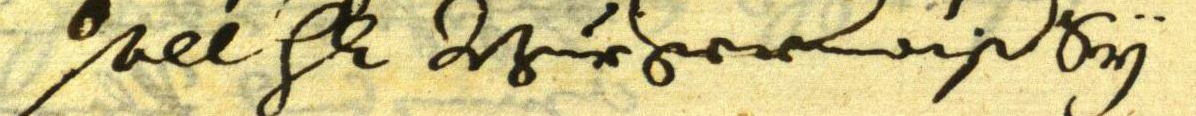soll hl Būrgermaist Sÿ
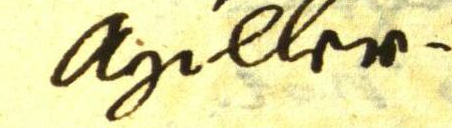Miller.
